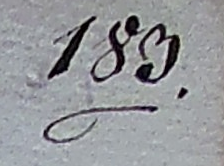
183.
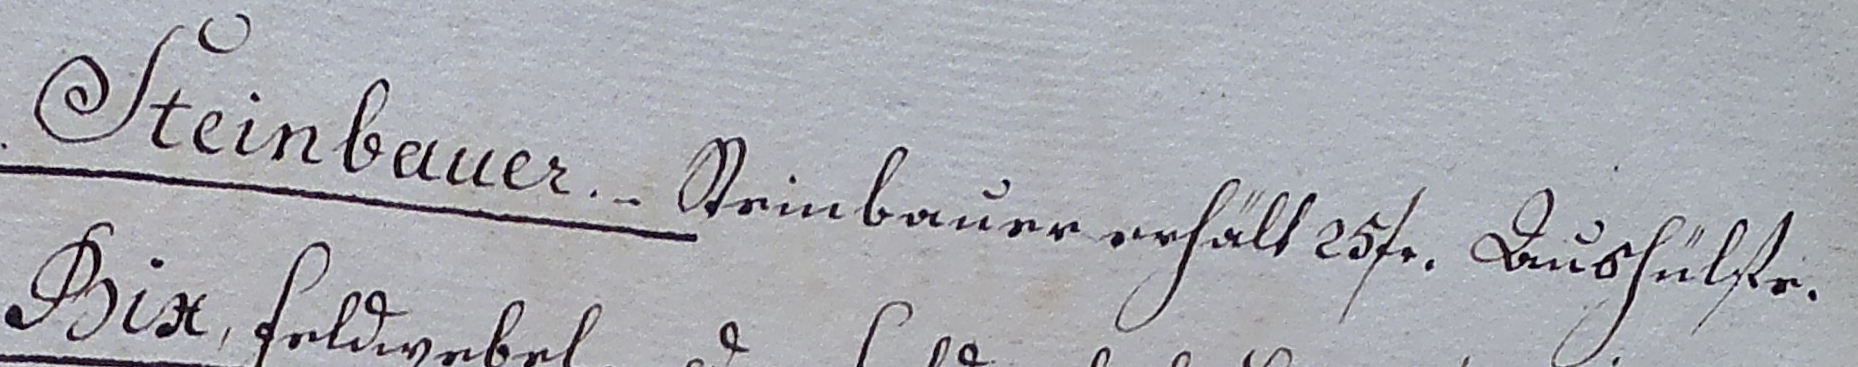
Steinbauer. .. Steinbauer erhält 25fr. Aushülfe.
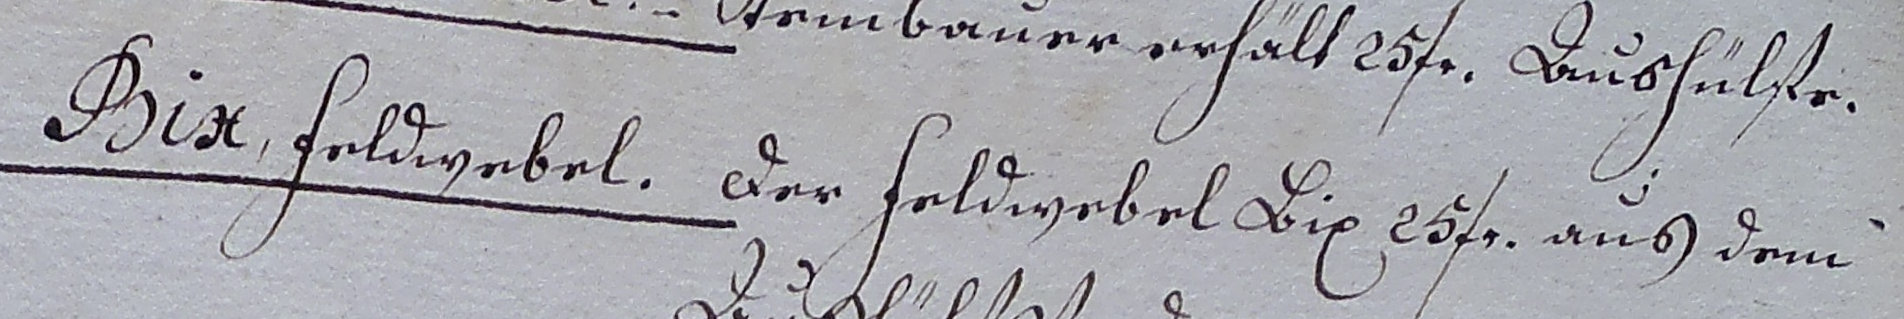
Bix, Feldwebel. Der Feldwebel Bix 25fr aus dem
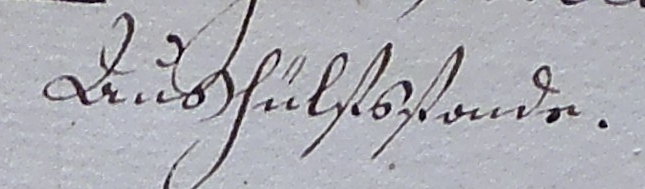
Aushülfsfonde.
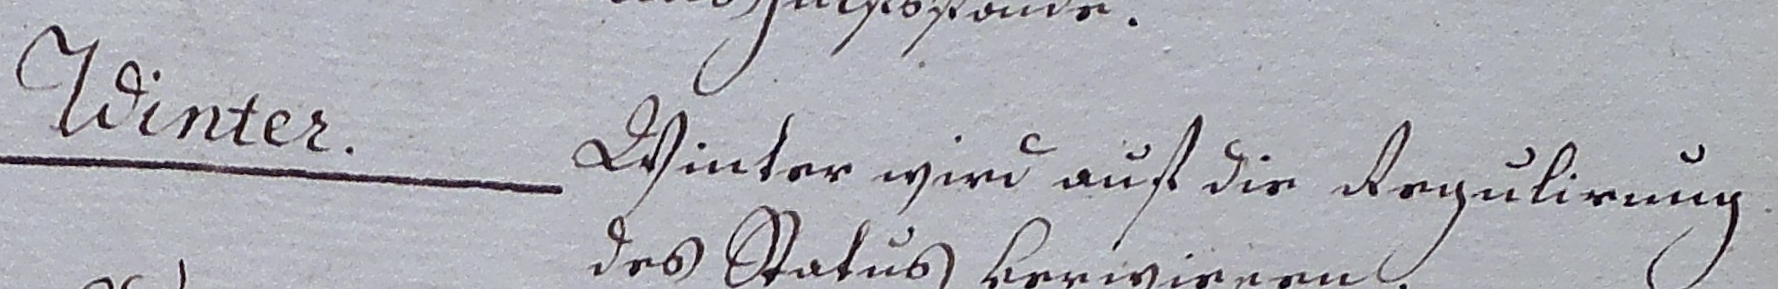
Winter. Winter wird auf die Regulirung
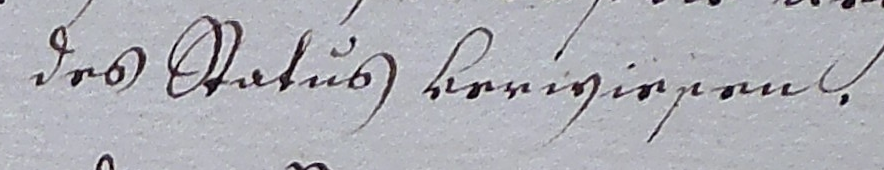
des Status verwiesen.
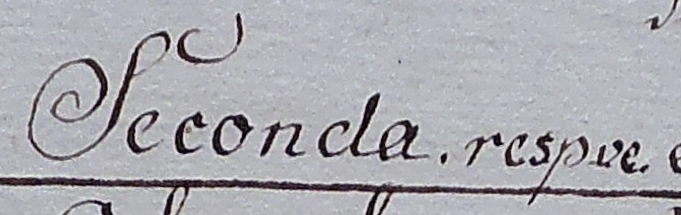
Seconda, respoe
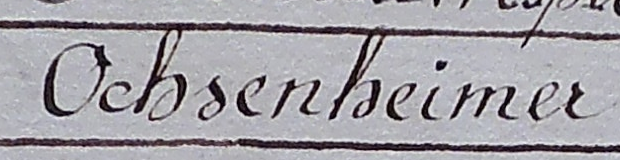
Ochsenheimer
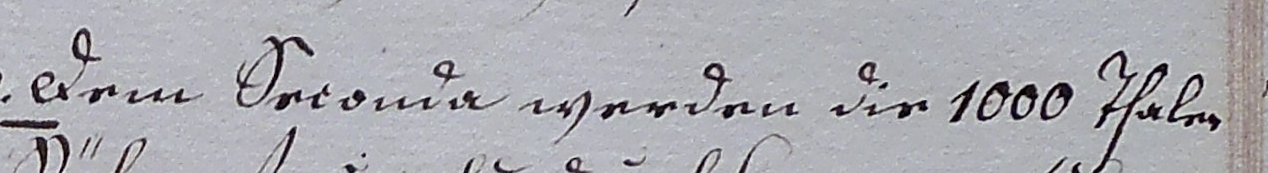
Dem Seconda werden die 1000 Thaler
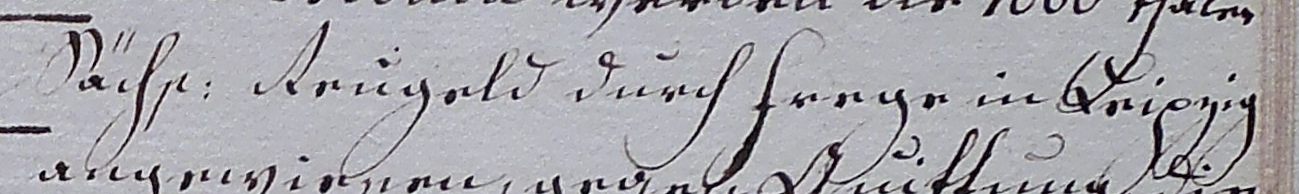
Sächs: Reisegeld durch Frege in Leipzig
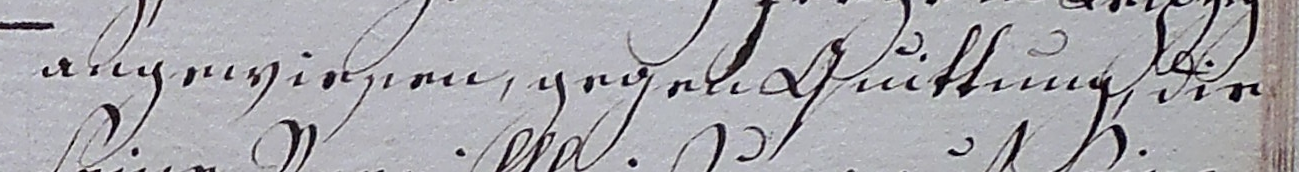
angewiesen, gegen Quittung, die
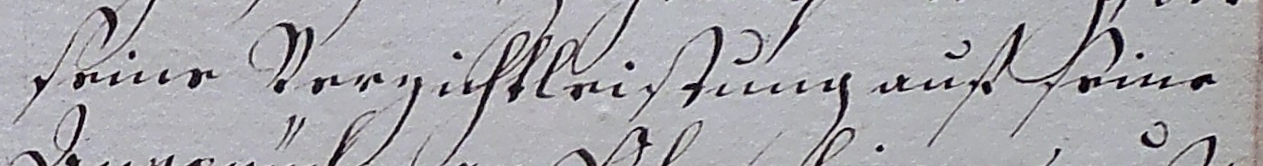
seine Verzichtleistung auf seine
